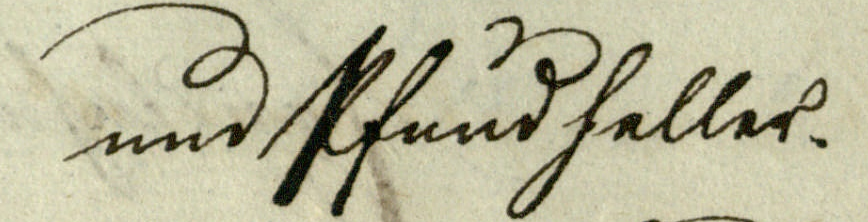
und Pfundheller.
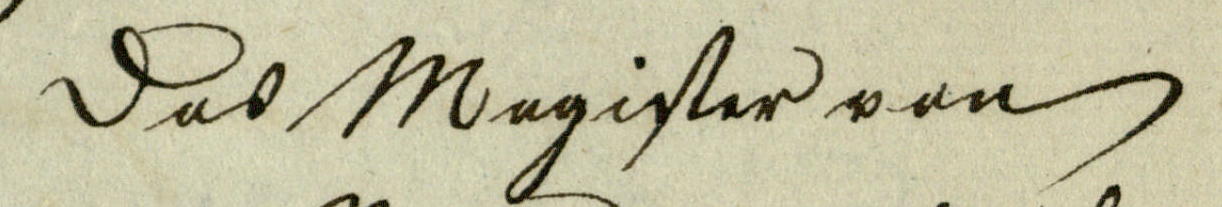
Das Magister von
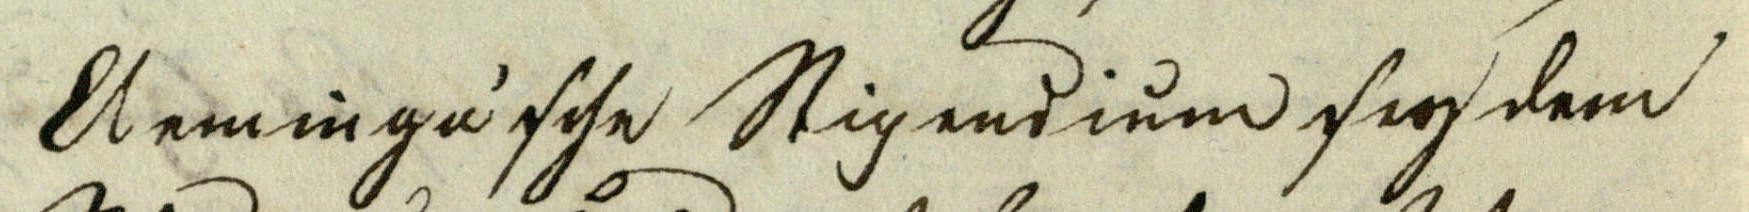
Aeminga'sche Stipendium sey dem
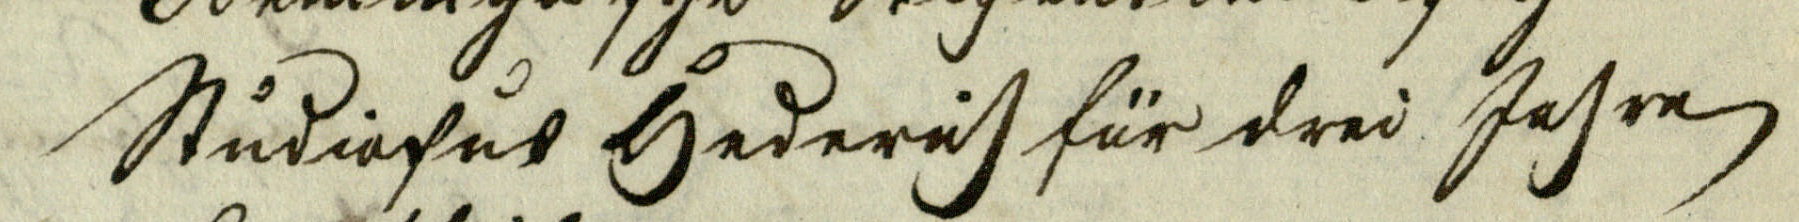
Studiosus Hederich für drei Jahre
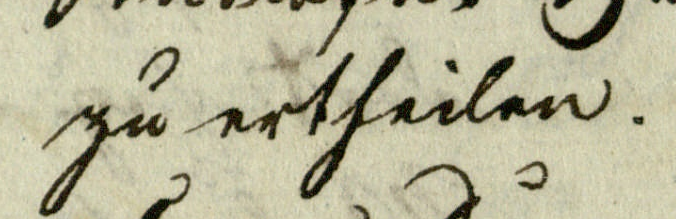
zu ertheilen.
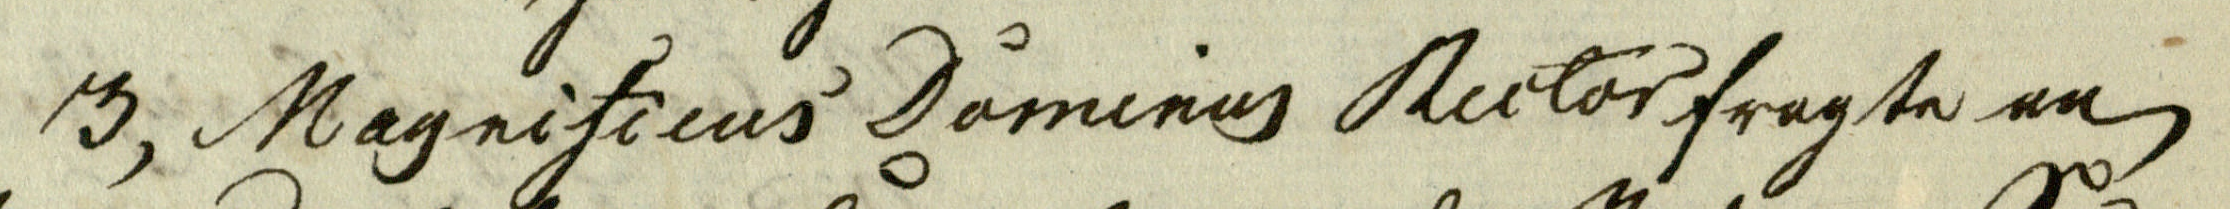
3, Magnificus Dominus Rector fragte an
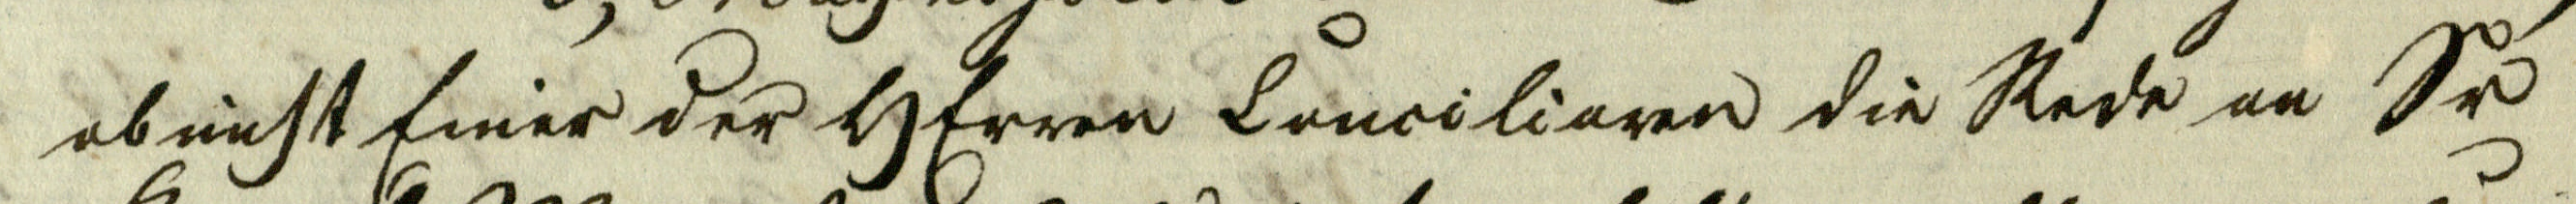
ob nicht Einer der HErren Conciliaren die Rede an Sr
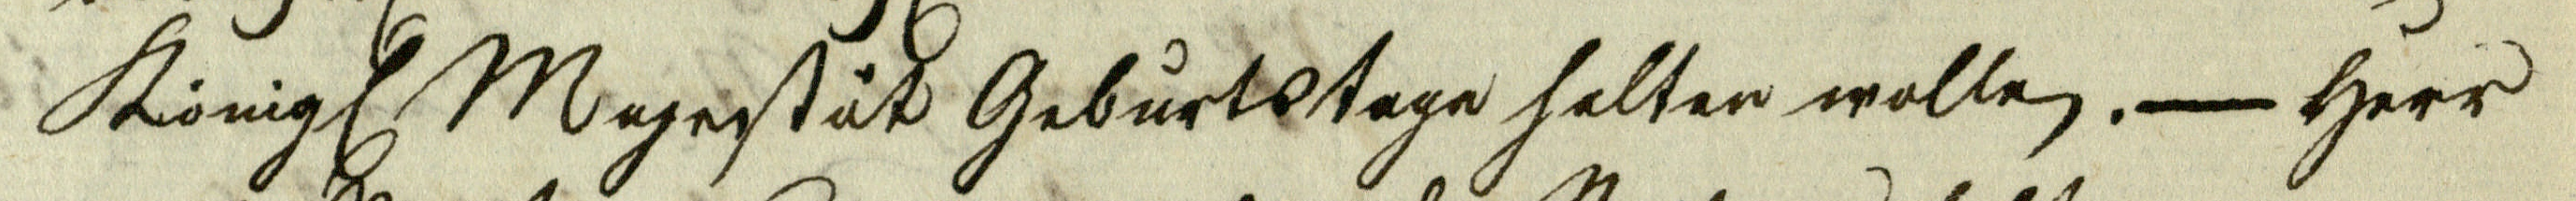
Königl Majestät Geburtstage halten wolle. ----- Herr
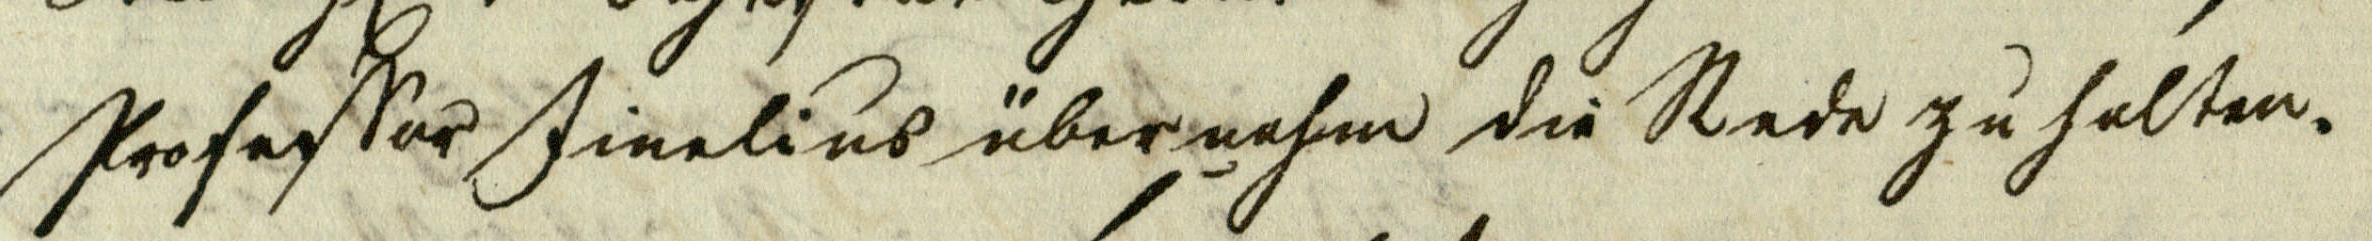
Professor Finelius übernahm die Rede zu halten.
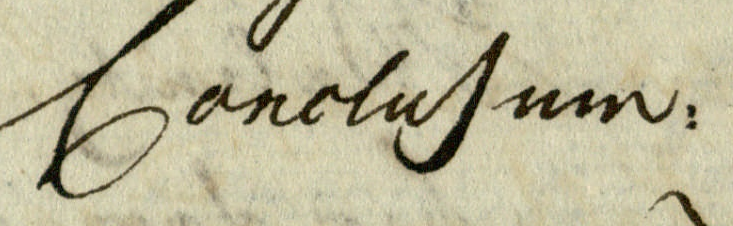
Conclusum:
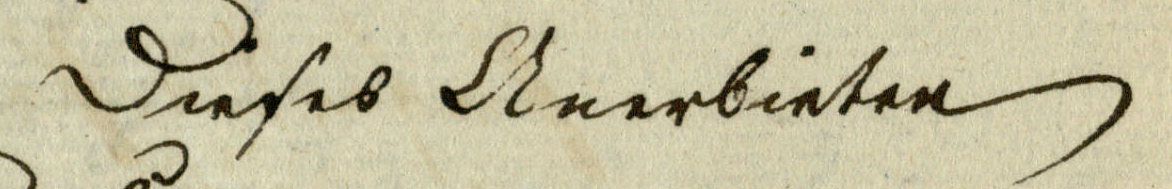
Dieses Anerbieten
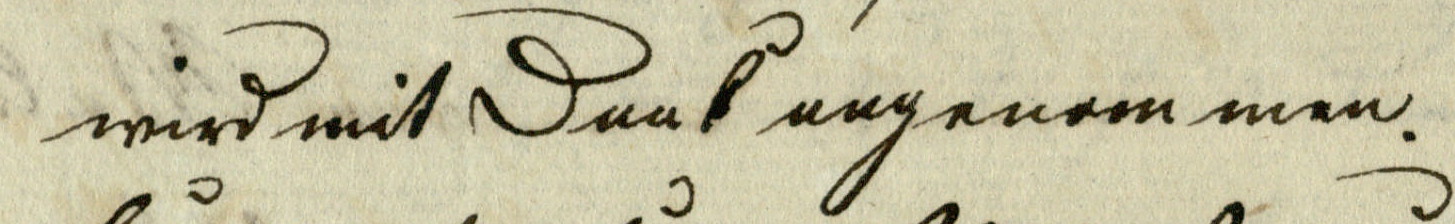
wird mit Dank angenommen.
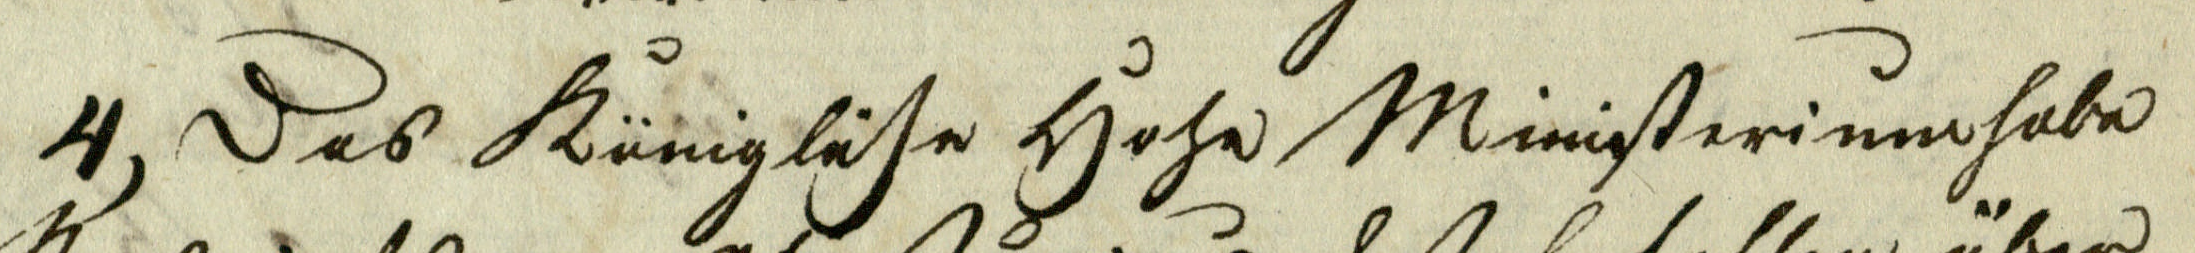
4, Das Königliche Hohe Ministerium habe
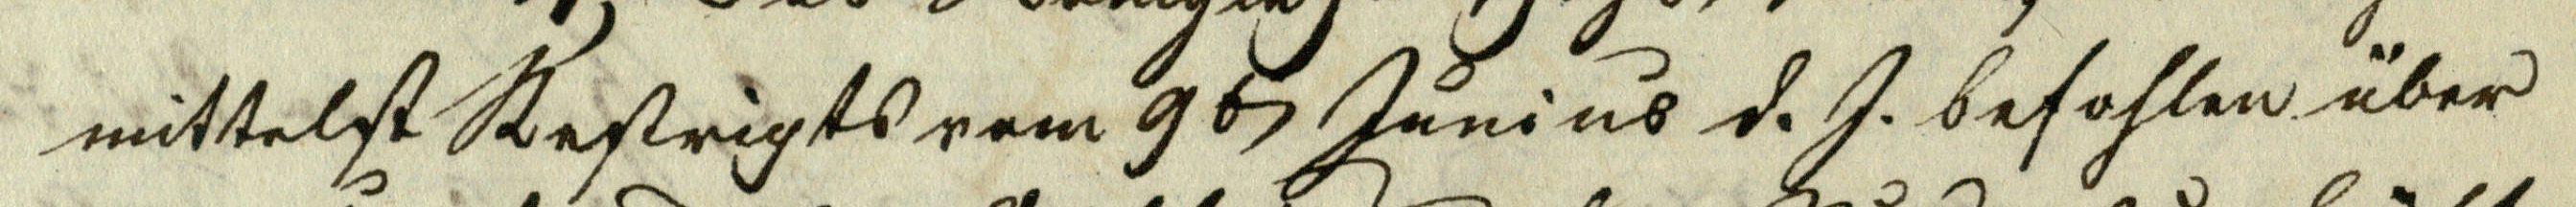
mittelst Rescripts vom 9ten Junius d. J. befohlen über
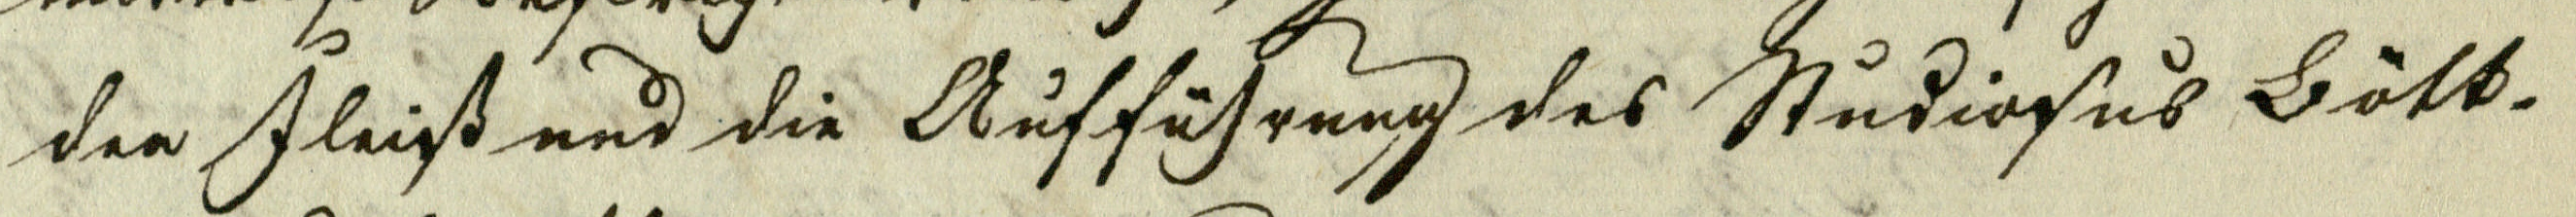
den Fleiß und die Aufführung des Studiosus Bött¬
